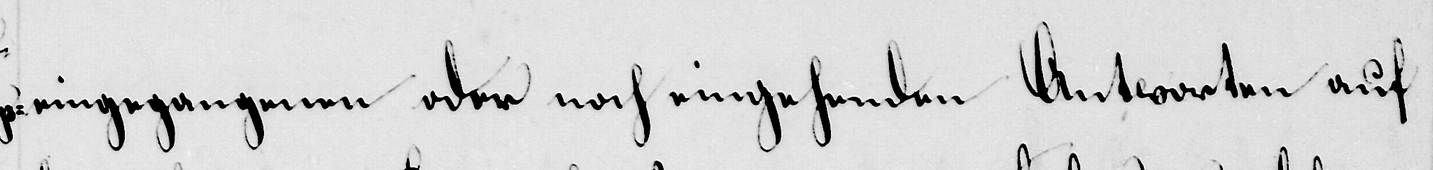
eingegangenen oder noch eingehenden Antworten auf
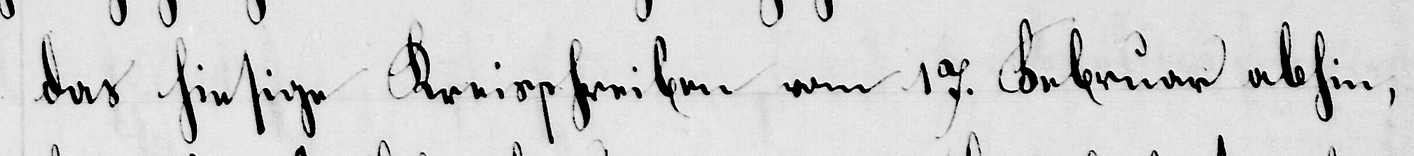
das hiesige Kreisschreiben vom 17. Februar abhin,
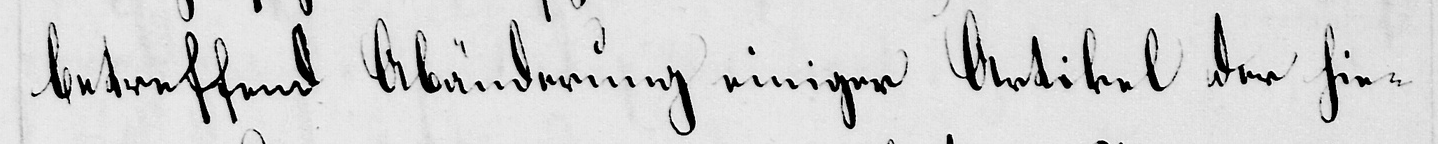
betreffend Abänderung einiger Artikel der hie¬
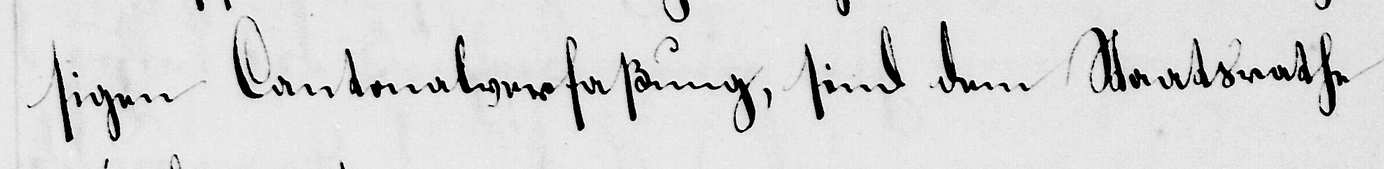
sigen Cantonalverfaßung, sind dem Staatsrathe
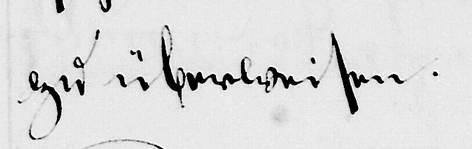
zu überweisen.
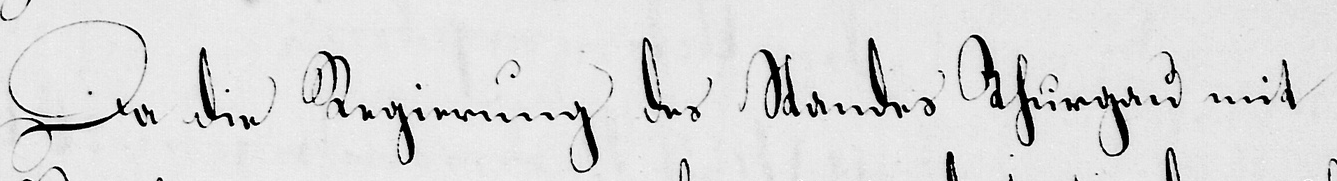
Da die Regierung des Standes Thurgau mit
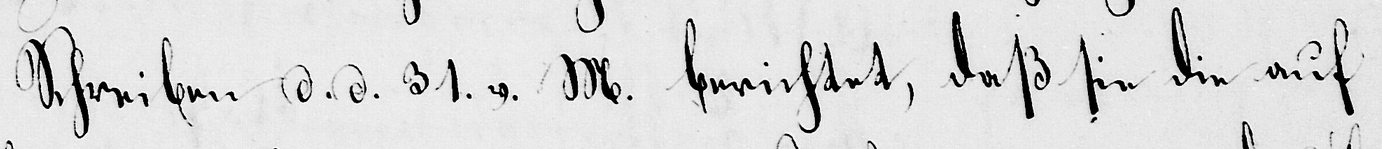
Schreiben d. d. 31. v. M. berichtet, daß sie die auf
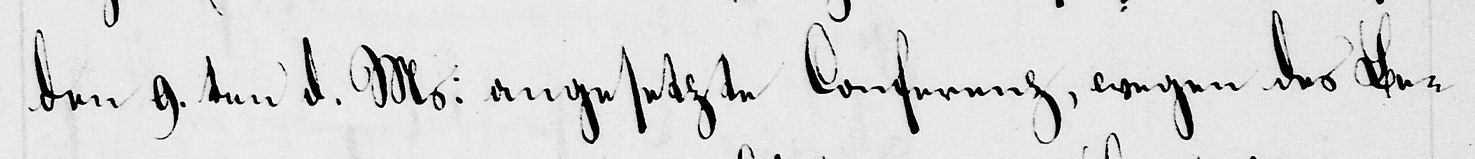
den 9.ten d. Ms. angesetzte Conferenz, wegen des Be¬
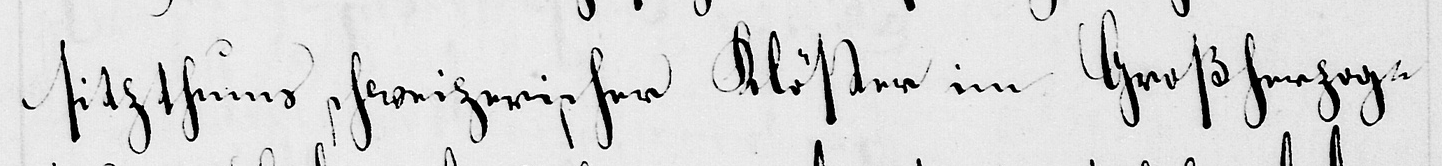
sitzthums schweizerischer Klöster im Großherzog¬
